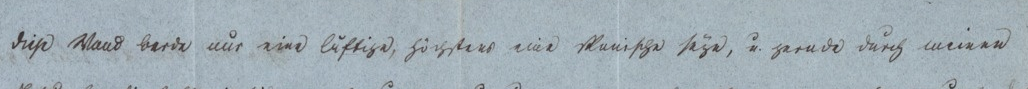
diese Wand werde nur eine luftige, höchstens eine spanische seyn, u. gerade durch meinen
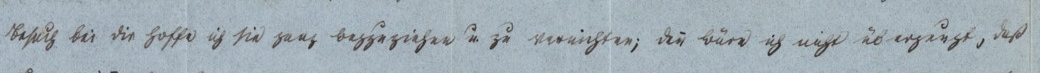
Besuch bei dir hoffe ich sie ganz wegzuziehen u. zu vernichten; denn wäre ich nicht überzeugt, daß
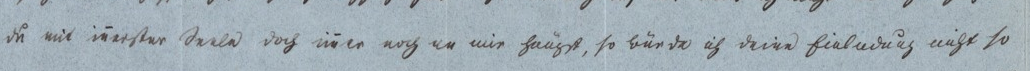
du mit innerster Seele doch immer noch an mir hängst, so würde ich deine Einladung nicht so
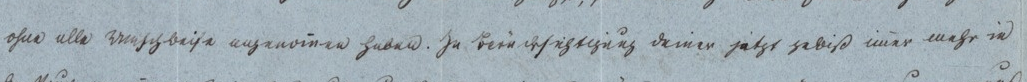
ohne alle Umschweife angenommen haben. In Berücksichtigung deiner jetzt gewiß immer mehr in
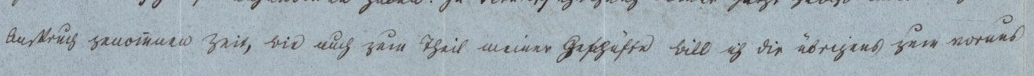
Anspruch genommnen Zeit, wie auch zum Theil meiner Geschäfte will ich dir übrigens zum voraus
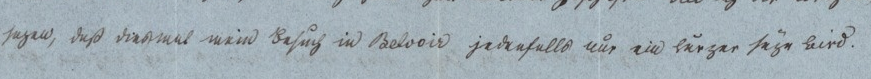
sagen, daß diesmal mein Besuch in Belvoir jedenfalls nur ein kurzer seyn wird.
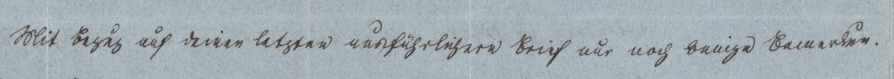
Mit Bezug auf deinen letzten ausführlichen Brief nur noch wenige Bemerkun-
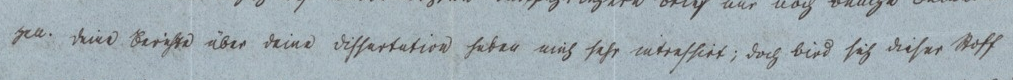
gen. Deine Berichte über deine Dissertation haben mich sehr intressirt; doch wird sich dieser Stoff
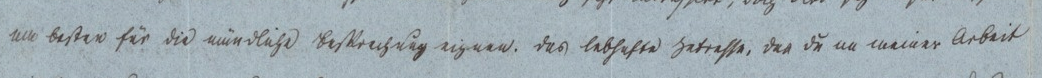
am besten für die mündliche Besprechung eignen. Das lebhafte Intresse, das du an meiner Arbeit
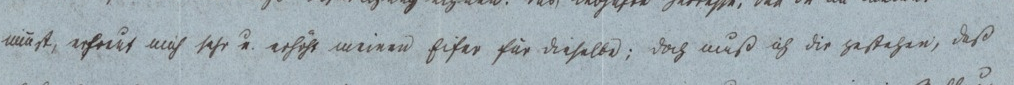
nimmst, erfreut mich sehr u. erhöht meinen Eifer für dieselbe; doch muß ich dir gestehen, daß
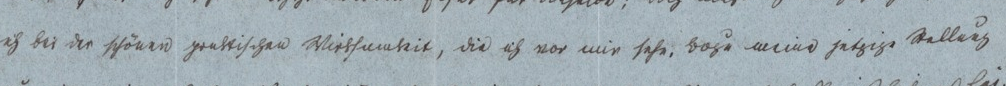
ich bei der schönen praktischen Wirksamkeit, die ich vor mir sehe, wozu meine jetzige Stellung
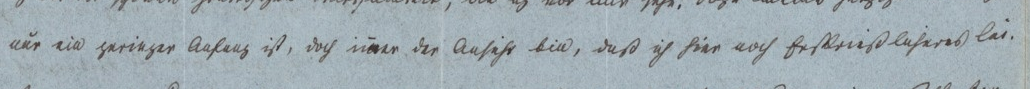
nur ein geringer Anfang ist, doch immer der Ansicht bin, daß ich hier noch Ersprießlicheres lei-
